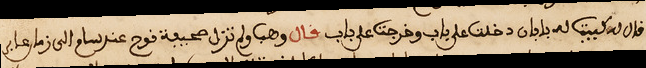قال له كبيت له بابان دخلت على باب خرجت على باب قال وهب ولم تزل صحيفة نوح عند سام الى زمان عابر
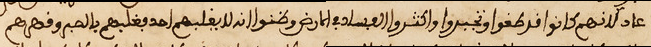عاد لانهم كانوا قد طغوا وتجبروا واكثروا الفساد في الارض وظنوا انه لا يغلبهم احد فغلبهم بالصبر وقهرهم
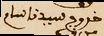خروج سيدنا سام
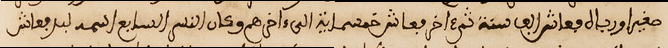صغير او رجال فعاش الف سنة ثم ءاخر فعاش خمسماية الى ءاخرهم وكان النسر السابع اسمه لبر فعاش
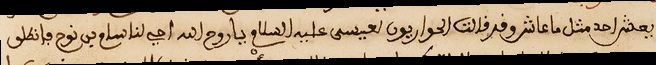يعش احد مثل ما عاش وقد قالت الحواريون لعيسى عليه السلام ياروح الله احي لنا سام بن نوح فانطلق
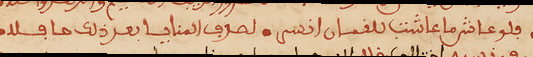فلو عاش ما عاشت للقمان انسر لصرف المايا بعد ذلك حافلا
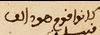كانوا قوم هود الف
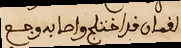لقمان قد اختلج واصابه وجع
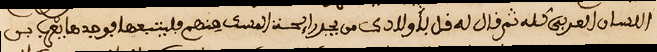اللسان العربى حله ثم قال له قل لا ولادك من يجد رائحة المسك منهم فليتبعها فوجدها يعرب بن
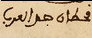قحطان جد العرب
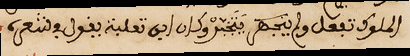الملوك تفعل ولم يتجهر يتجبر وكان ابن تعلبة يقول في شعره
